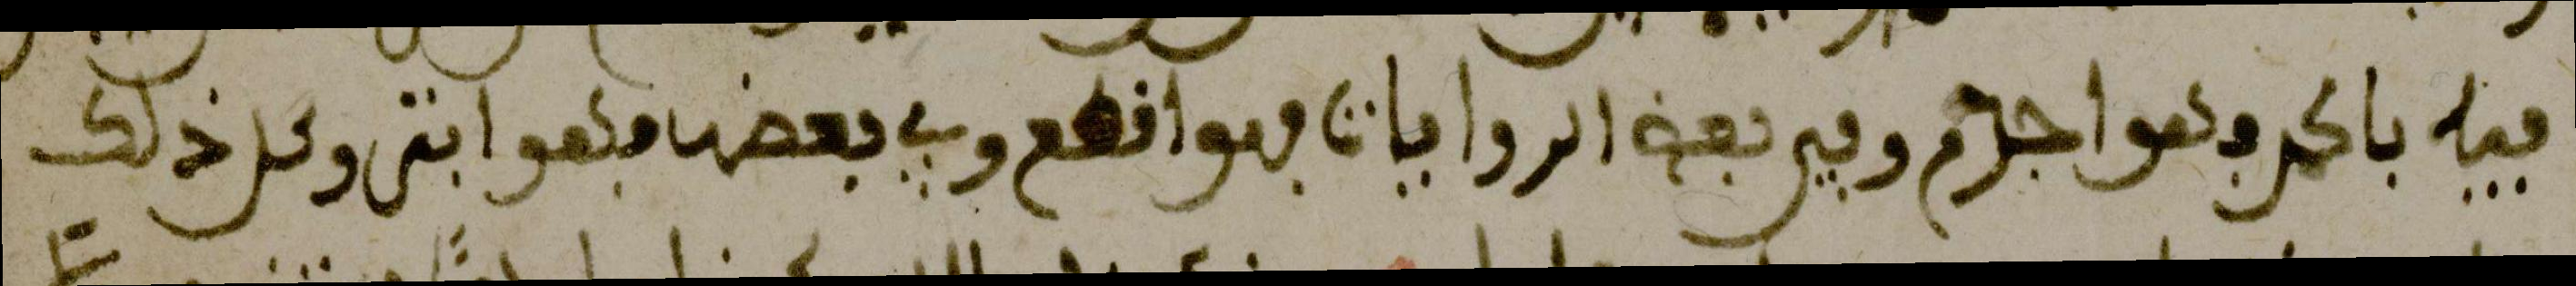فيه بالحمد فهواجذم وفي بعض الروايات فهو اقطع وفي بعضها فهو ابتر وكل ذلك
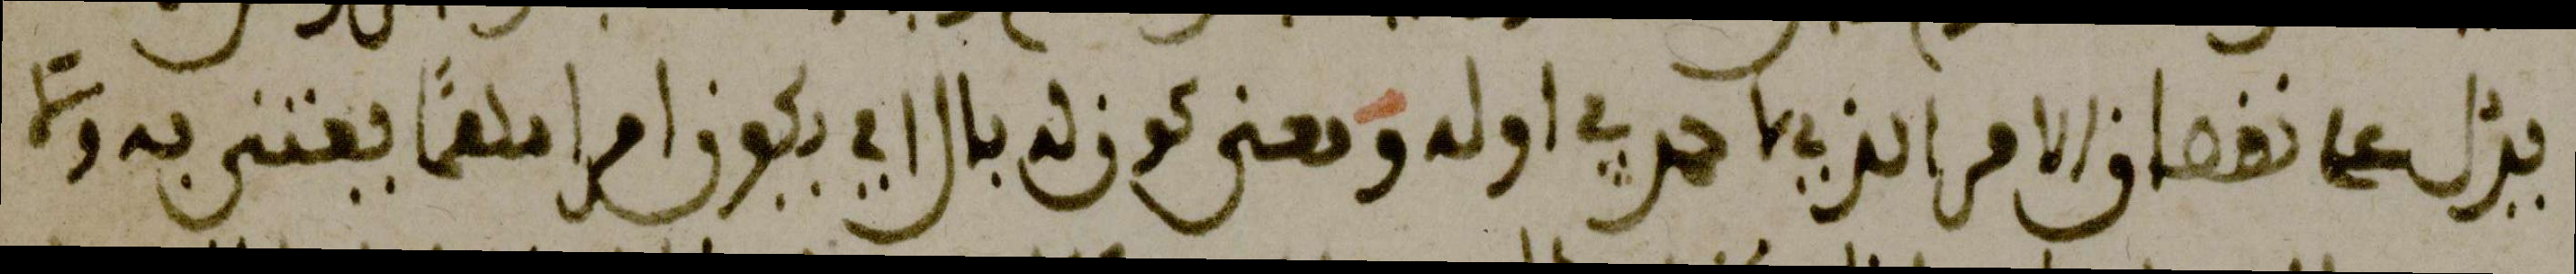يدل على نقصان الامر الذي لا حمد في اوله ومعنى كون له بال اي يكون امرا مهما يعتنى به ولا
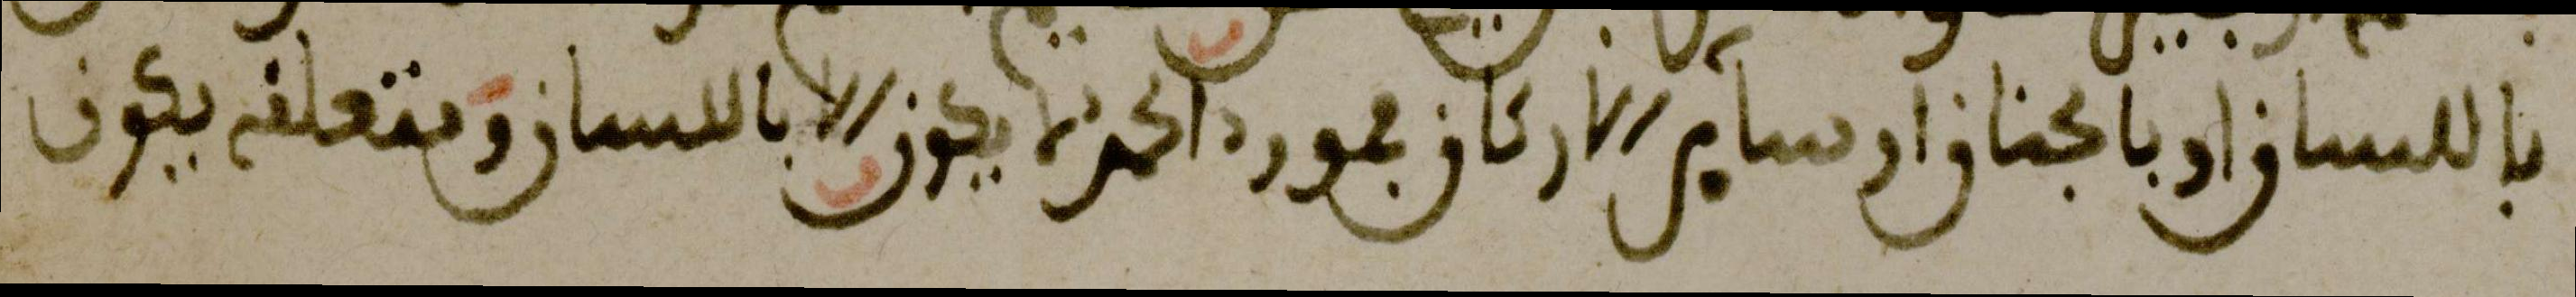باللسان او بالجنان اوسائر الاركان فمورد الحمد لا يكون الا باللسان ومتعلقه يكون
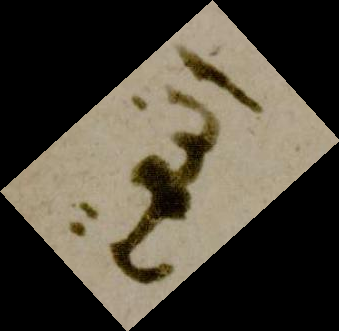النعمة
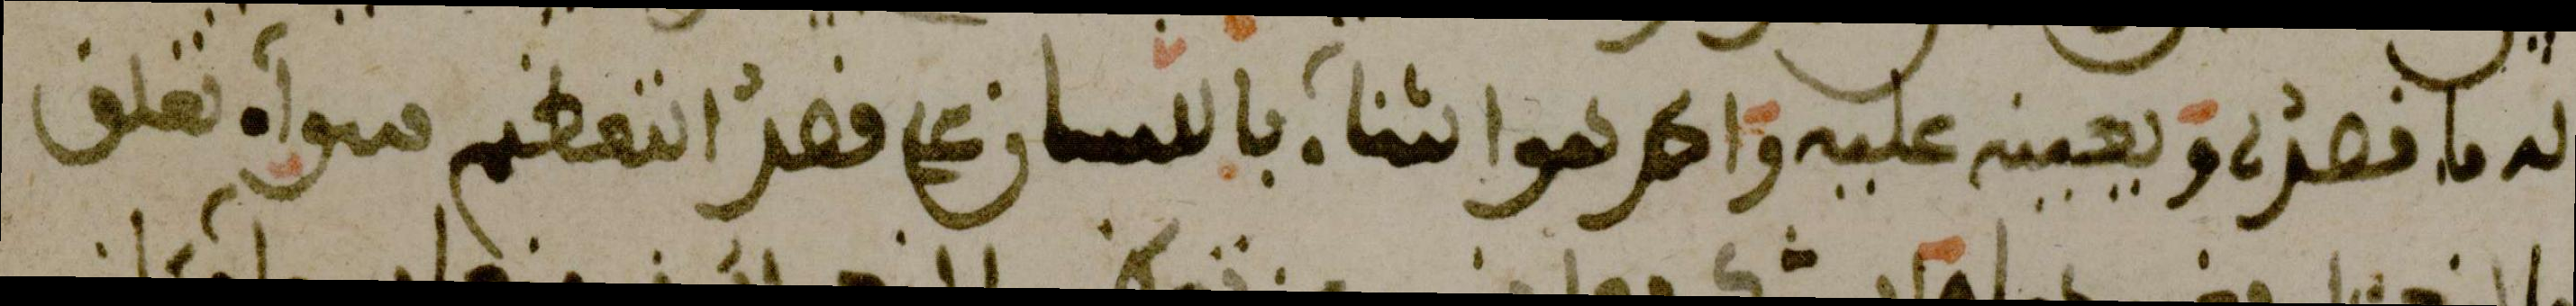له ماقصده ويعينه عليه والحمد هو الثناء باللّسان على فصد التعظيم سواء تعلق
